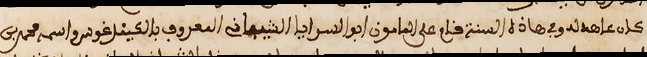كان عاهد وفي هاذه السنة قام على المامون ابو السرايا الشيبانى المعروف بالكيندغوس واسمه محمد بن
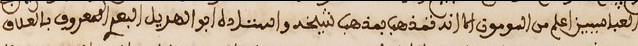العباسيين اعلم من المومون الا انه تمذهب بمذهب شيخه واستاده ابو الهديل البصرى المعروف بالعلاف
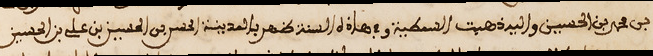بن محمد بن الحسين واليه ذهبت السمطية وفي هاذه السنة ظهر بالمدينة الحسن بن الحسين بن على بن الحسين
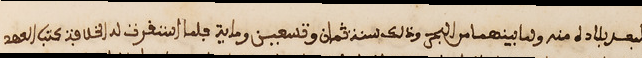لبعد بلاده منه ولما بينهما من البحر وذلك سنة ثمان وتسعين وماية فلما استقرت له الخلافة كتب العهد
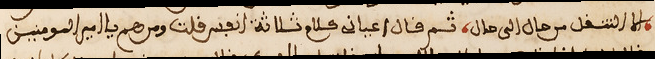الا التنقل نت حال الى حال ثم قال اعيانى كلام ثلاثة انفس قلت ومن هم يا امير المومنين
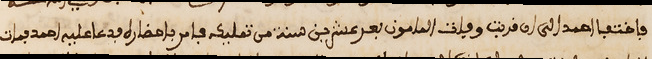فاختفا احمد الى ان قربت وفات المامون بعد عشرين سنة من تمليك فامر باحضاره فدعا عليه احمد فمات
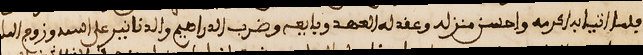فلما اتيا به اكرمه واحسن منزله وعقد له العهد وبايعه وضرب الدراهيم الدنانير على اسمه وزوج الما
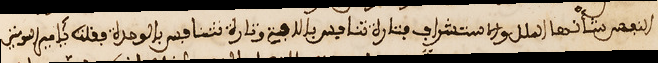النفس شأنها الملل والاستشراف فتارة تنافس بالافتى وتارة تتنافس بالوحدة فقلت يامير المومنين
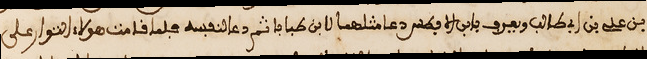بن على بن ابى طالب ويعرف بابن الافطاس دعا مثلهما لابن طبابا ثم دعا لنفسه فلما قامت هولاء التوار على
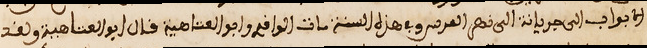الابواب الى جديانة الى نهر الهرس وفي هذه السنة مات الواقدى وابو العتاهية قال ابو العتاهية ولقد
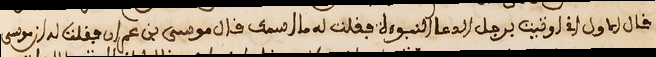قال الاول انى او تيت برجل الدعا النبوءة فقلت له ما اسمك قال موسى بن عمر ان فقلت له ان موسى
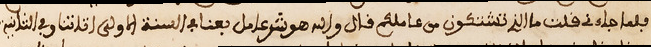فلما جاءنى قلت ما الذي تشتكون من عاملكم قال والله هوشر عامل بعنا في السنة الاولى اتاتنا وفي الثانية
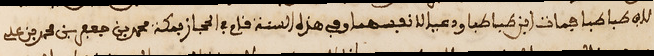لابن طباطبا فمات ابن طباطبا ودعيا لا نفسهما وفي هذه السنة قام في الحجاز بمكة محمد بن جعفر بن محمد بن على
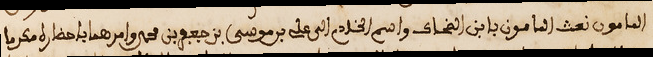المامون نعث المامون بابن الضحاك واسم الخادم الى على بن موسى بن جعفر بن محمد وامرهما باحضاره مكرما
